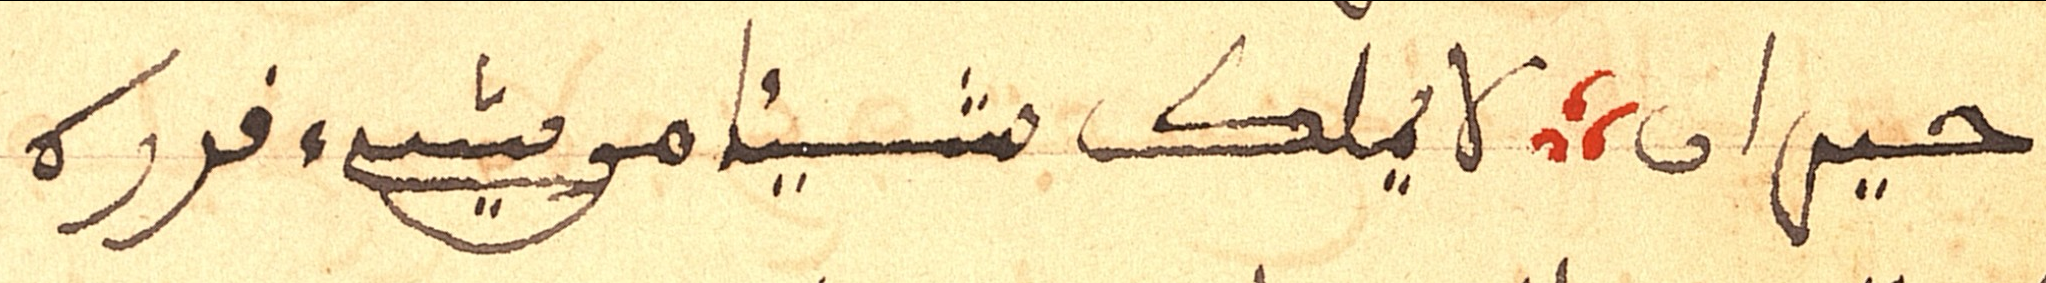حيران لايملك شيئا من شيئ قرره
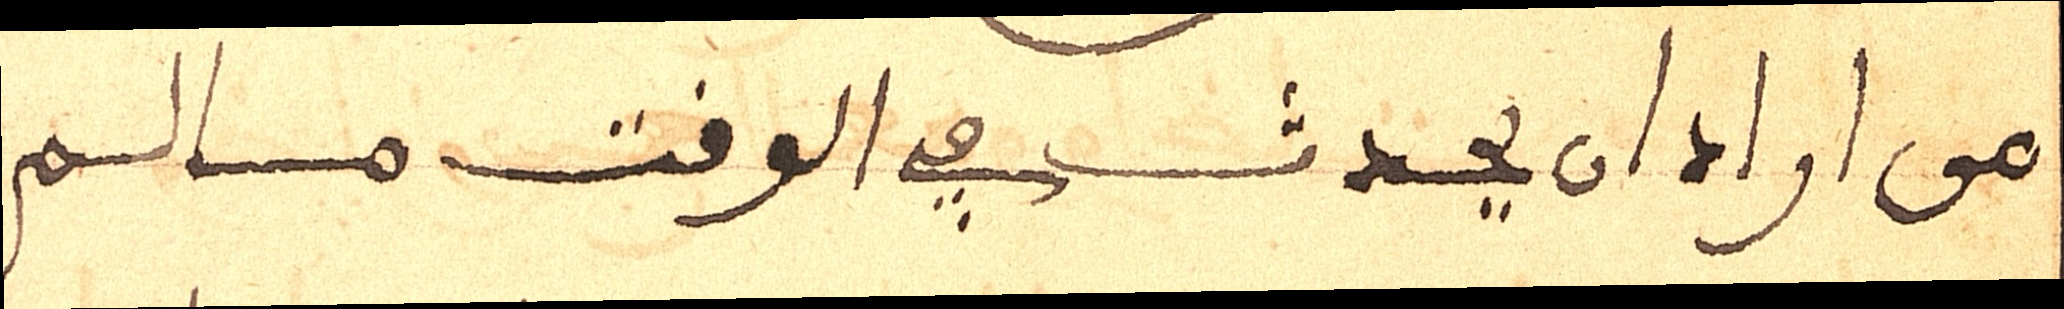من اراد ان يحدث في الوقت ما لم
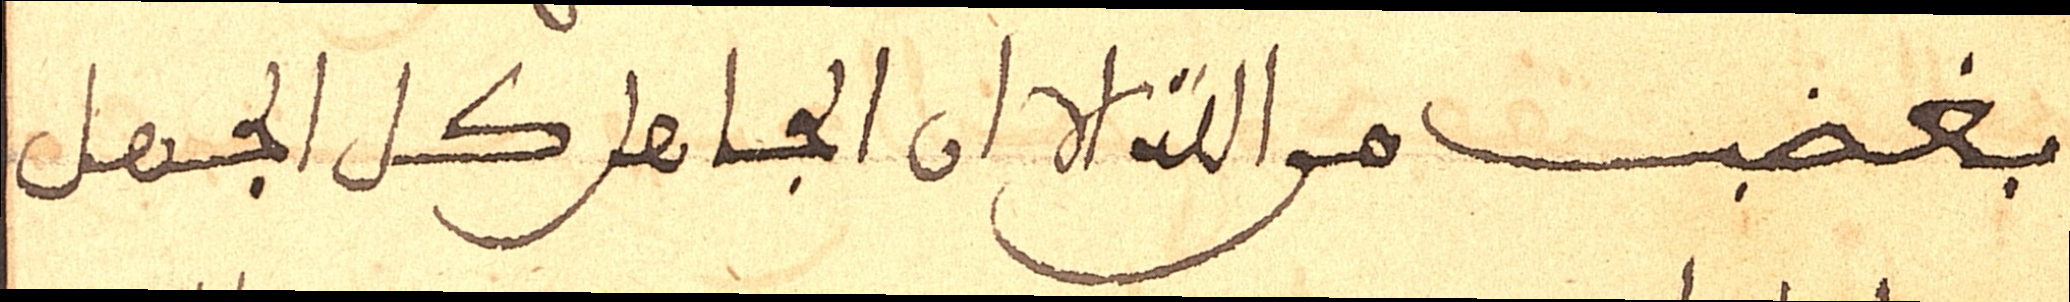بغضب من الله الا ان الجاهل كل الجهل
